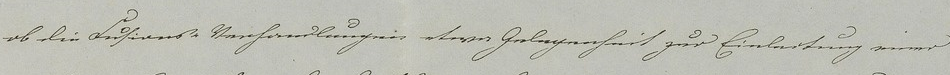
ob die Fusions-Verhandlungen etwa Gelegenheit zur Einleitung einer
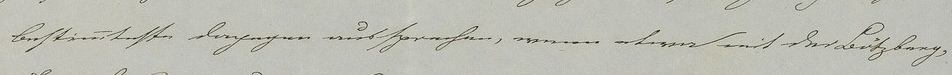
bestimmteste dagegen aussprechen, wenn etwa mit der Bötzberg-
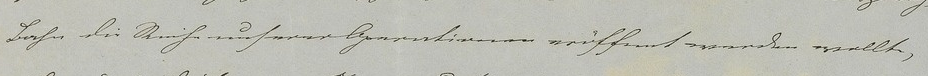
Bahn die Reihe unserer Operationen eröffnet werden wollte,
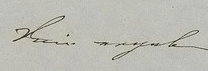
Dein ergebener
